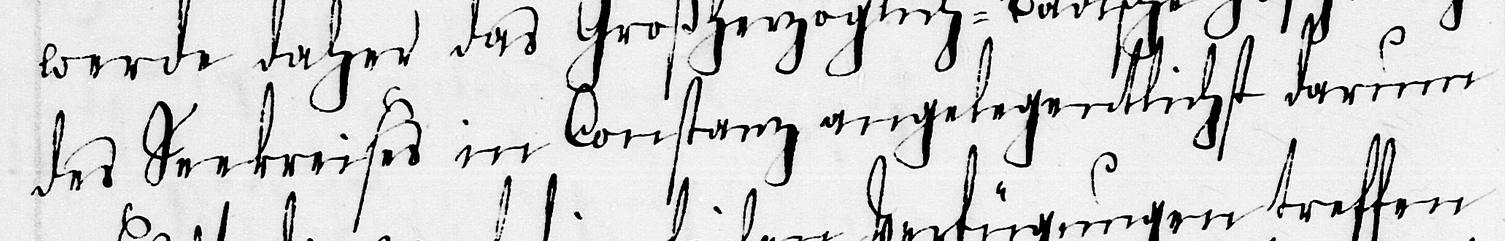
des Seekreises in Constanz angelegentlichst darum
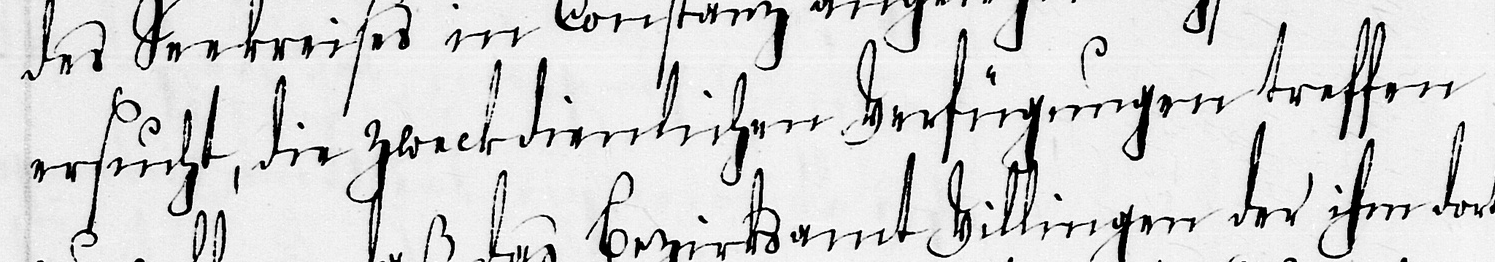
ersucht, die zweckdienlichen Verfügungen treffen
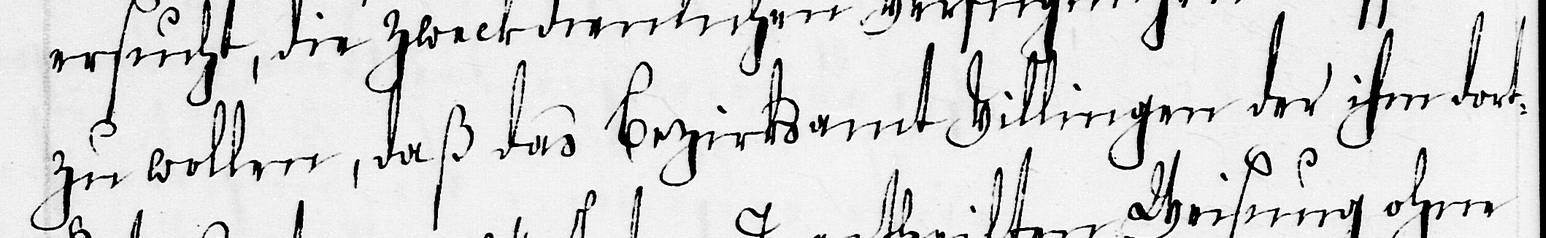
zu wollen, daß das Bezirksamt Villingen der ihm dor¬
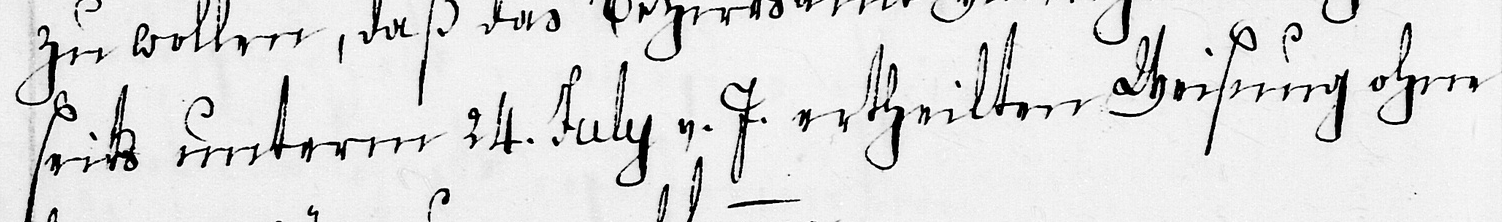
tseits unterm 24. July v. J. ertheilten Weisung ohne
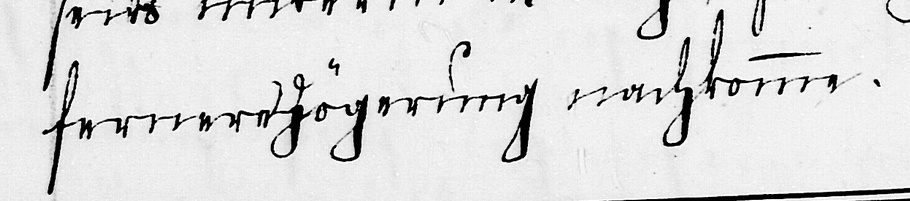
fernere Zögerung nachkomme.
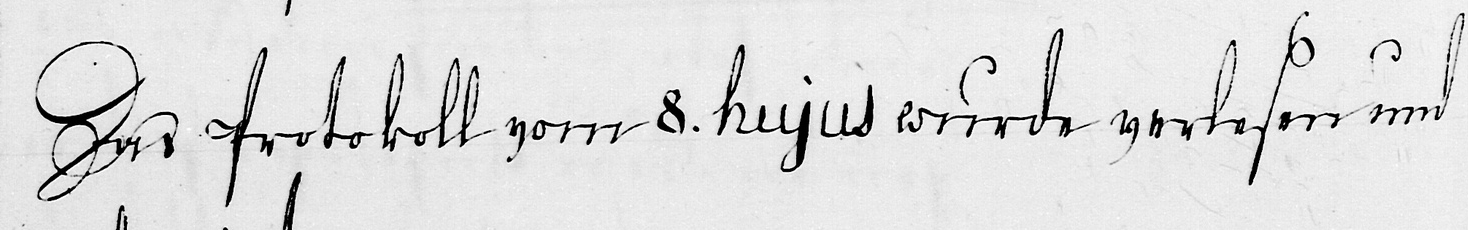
Das Protokoll vom 8. hujus wurde verlesen und
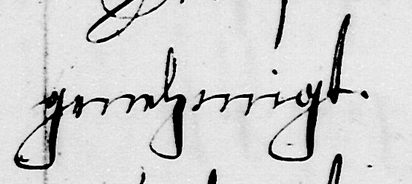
genehmigt.
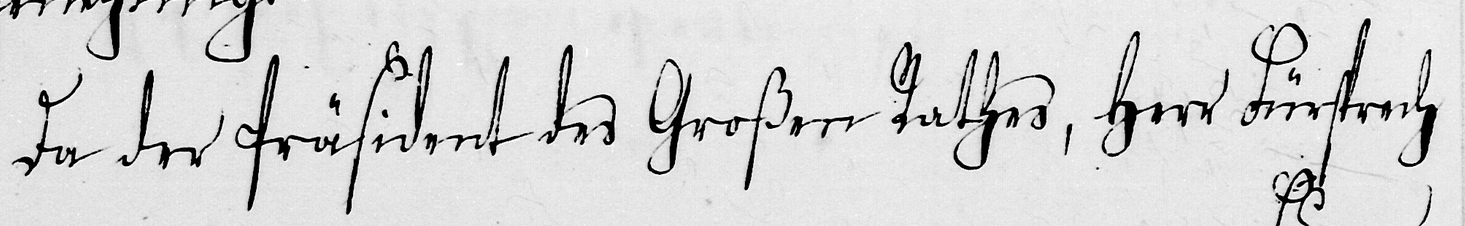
Da der Präsident des Großen Rathes, Herr Fürstr¬
